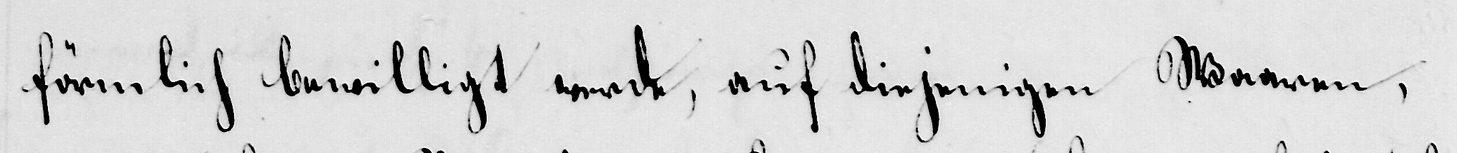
förmlich bewilligt werde, auf diejenigen Waaren,
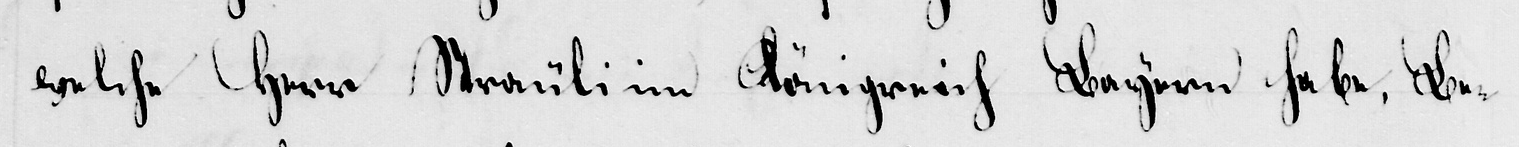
welche Herr Sträuli im Königreich Bayern habe, Be¬
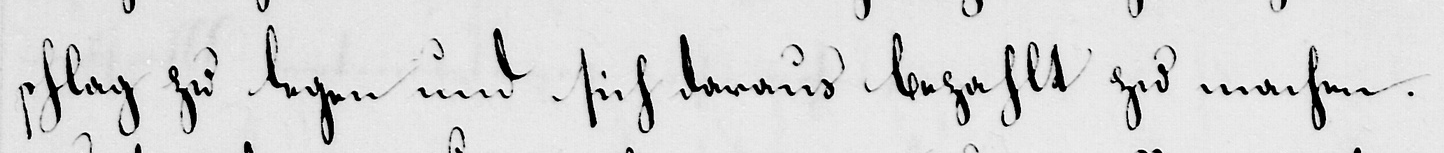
schlag zu legen und sich daraus bezahlt zu machen.
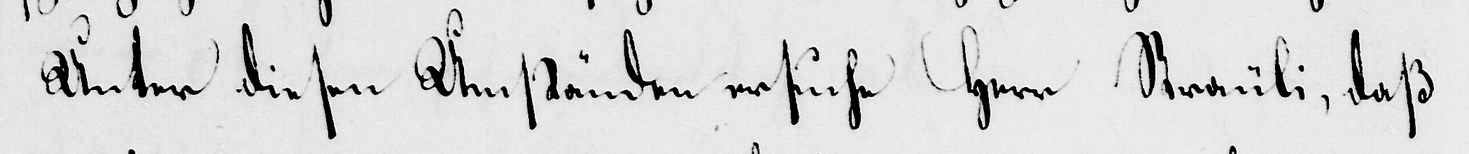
Unter diesen Umständen ersuche Herr Sträuli, daß
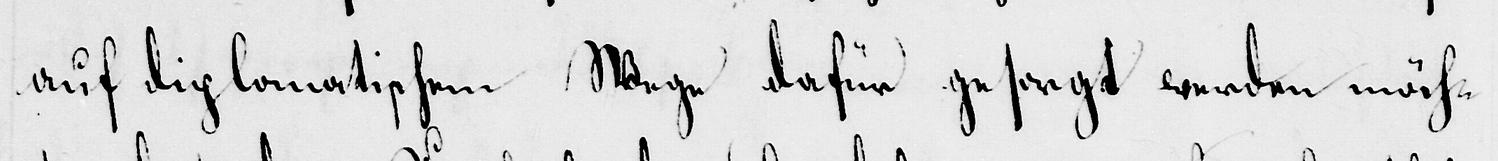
auf diplomatischem Wege dafür gesorgt werden möch¬
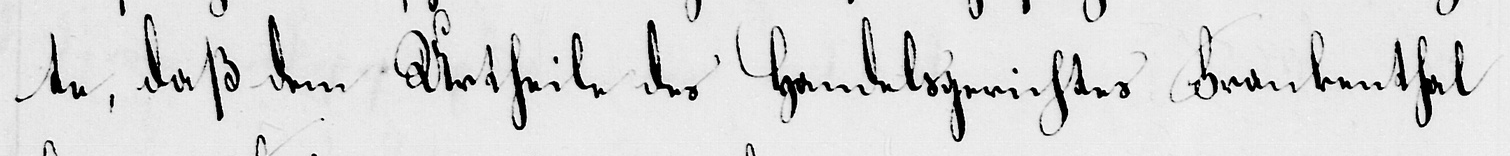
te, daß dem Urtheile des Handelsgerichtes Frankenthal
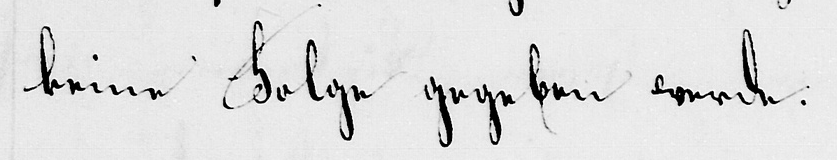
keine Folge gegeben werde.
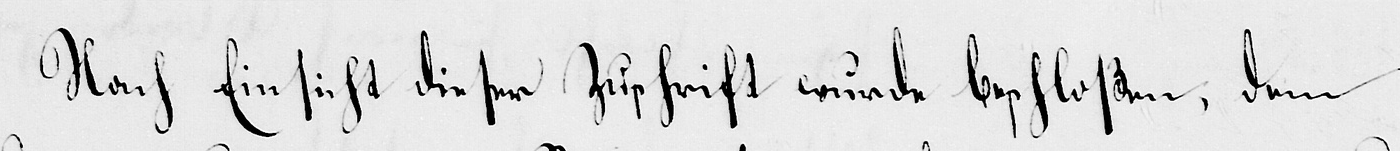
Nach Einsicht dieser Zuschrift werde beschloßen, dem
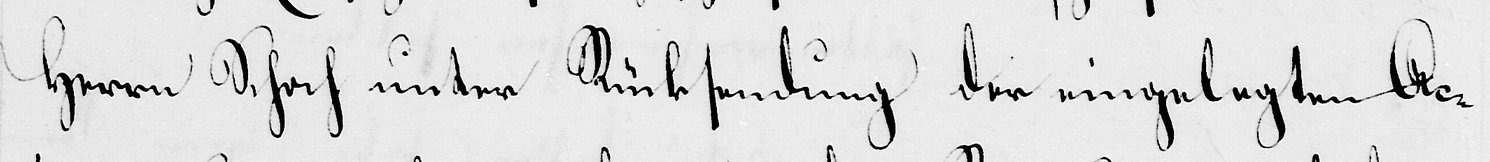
Herrn Schoch unter Rücksendung der eingelegten Ac¬
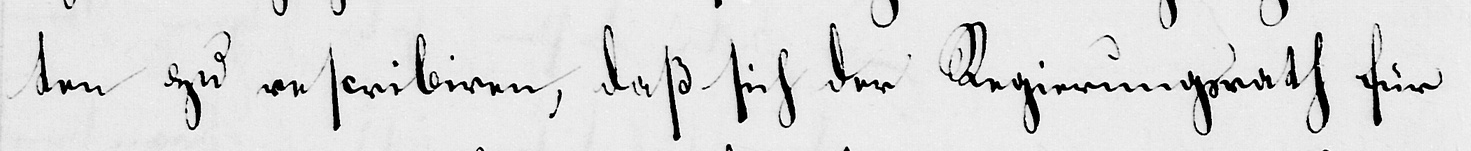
ten zu rescribiren, daß sich der Regierungsrath für
